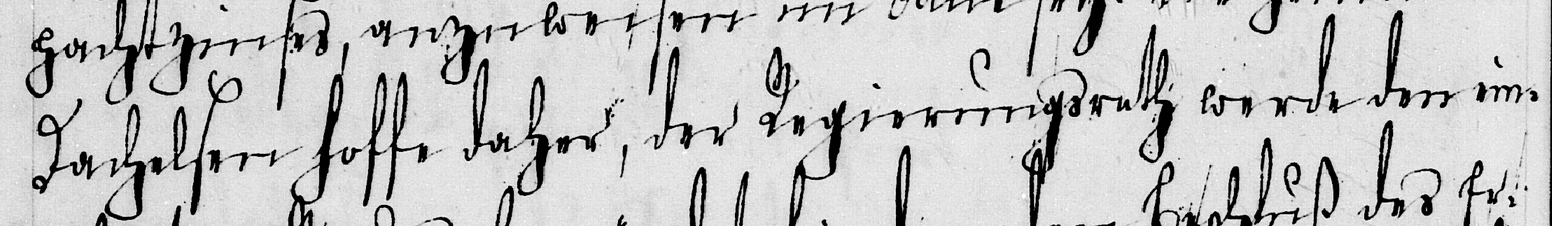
Dachelsen hoffe daher, der Regierungsrath werde den ei¬
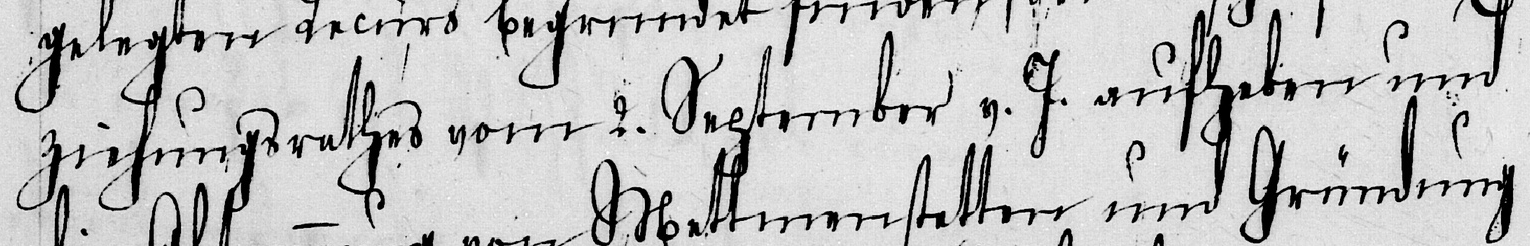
ziehungsrathes vom 2. September v. J. aufheben und
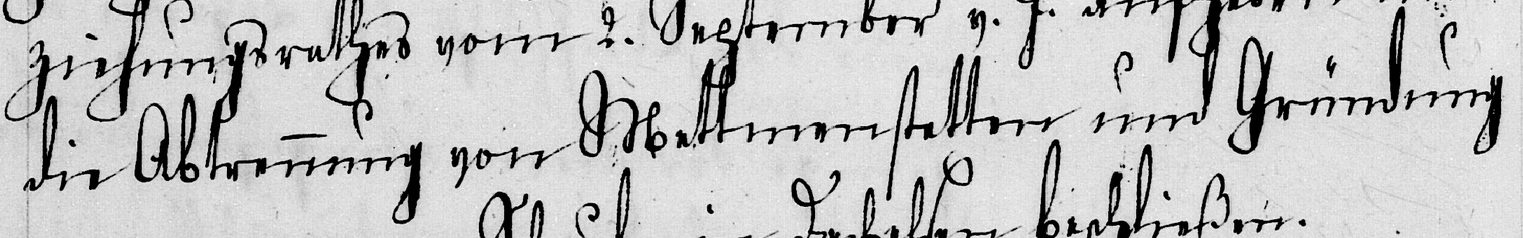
die Abtrennung von Mettmenstetten und Gründung
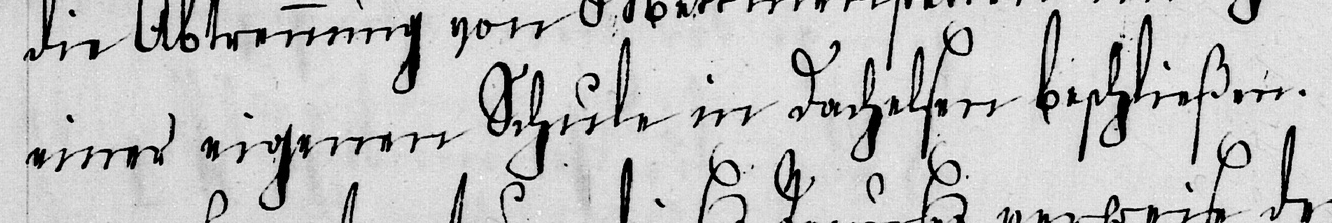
einer eigenen Schule in Dachelsen beschließen.
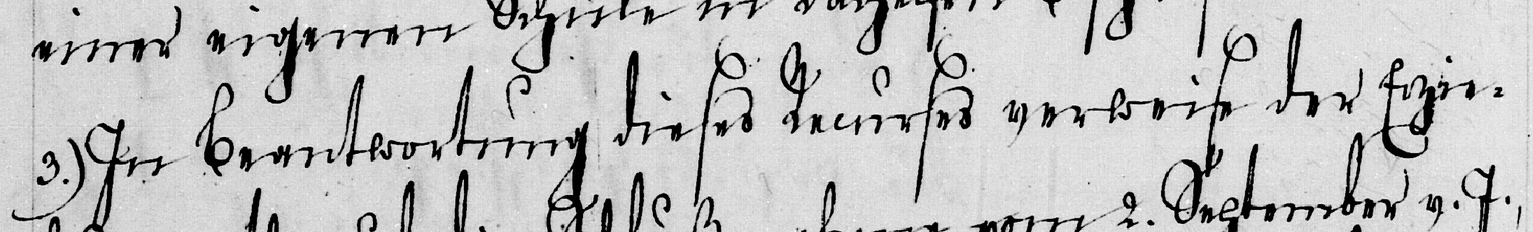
3.) In Beantwortung dieses Recurses verweise der Erzie¬
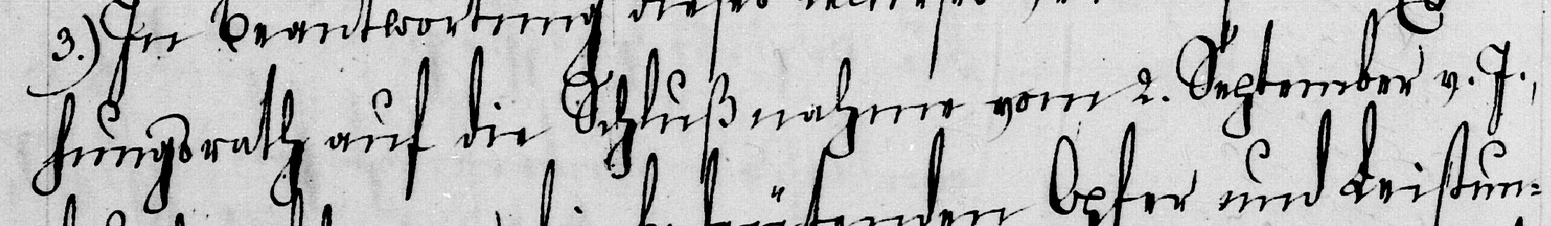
hungsrath auf die Schlußnahme vom 2. September v. J.
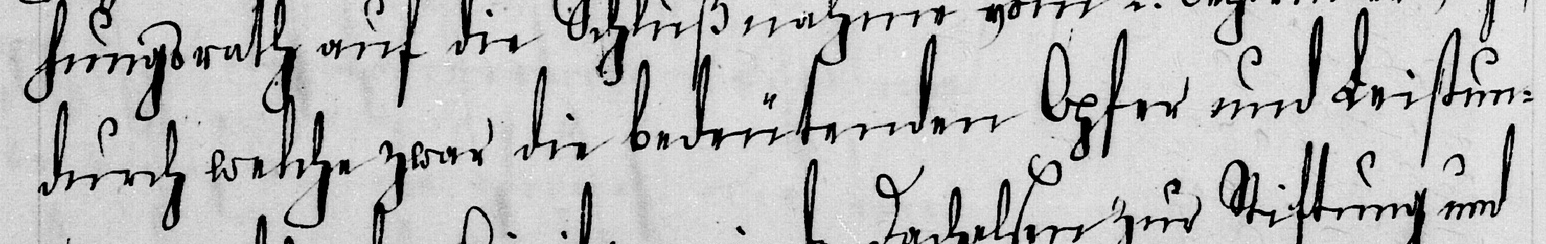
durch welche zwar die bedeutenden Opfer und Leistun¬
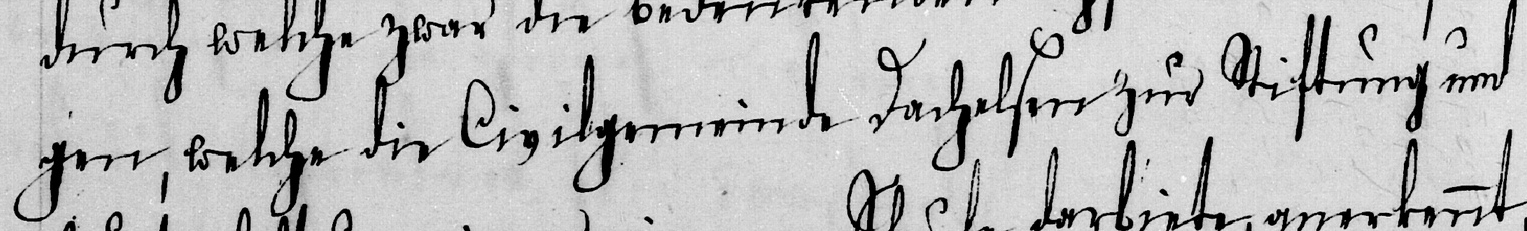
gen, welche die Civilgemeinde Dachelsen zur Stiftung und
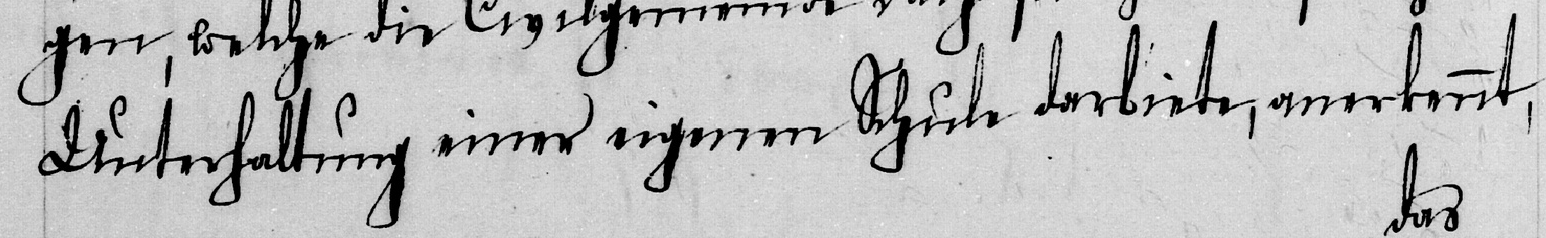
Unterhaltung einer eigenen Schule darbiete, anerkennt,
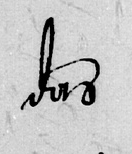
das
